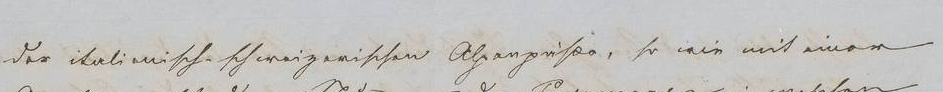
der italienisch-schweizerischen Alpenpäße, so wie mit einer
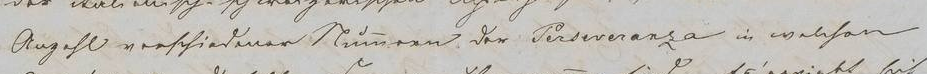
Anzahl verschiedener Nummern der Perseveranza in welchen
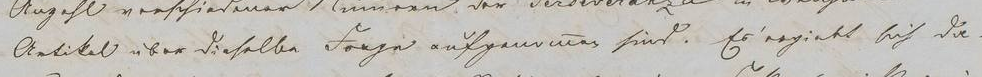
Artikel über dieselbe Frage aufgenommen sind. Es ergiebt sich da-
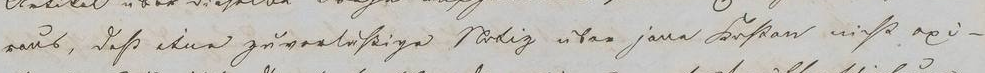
raus, daß eine zuverläßige Notiz über jene Kosten nicht exi-
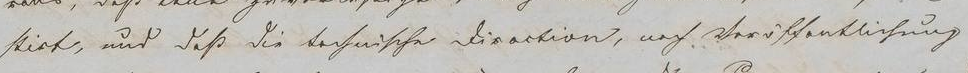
stirt, und daß die technische Direction, nach Veröffentlichung
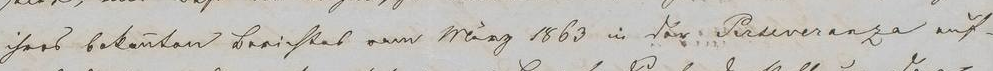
ihres bekannten Berichtes vom März 1863 in der Perseveranza auf-
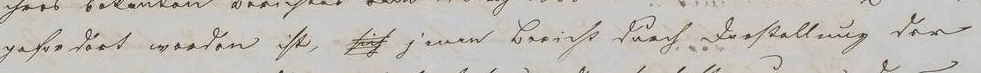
gefordert worden ist, sich jenen Bericht durch Darstellung der
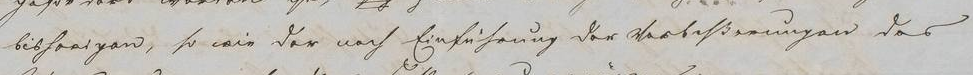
bisherigen, so wie der nach Einführung der Verbeßerungen des
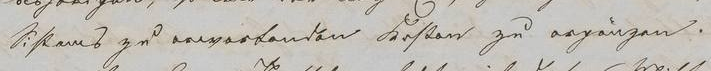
Sistems zu erwartenden Kosten zu ergänzen.
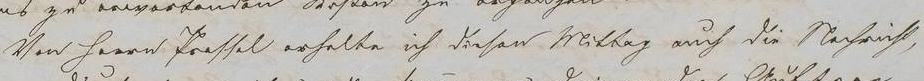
Von Herrn Pressel erhalte ich diesen Mittag auch die Nachricht,
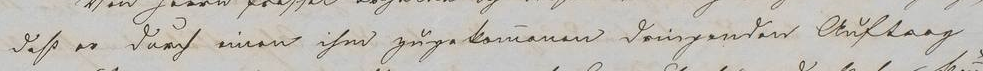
daß er durch einen ihm zugekommenen dringenden Auftrag
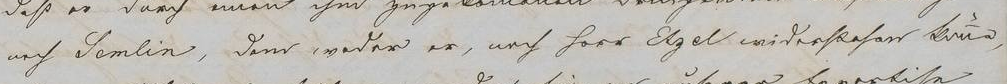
nach Semlin, dem weder er, noch Herr Etzel widerstehen könne,
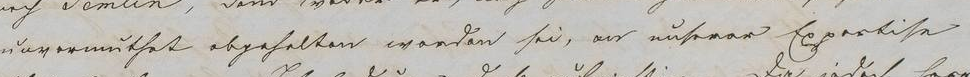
unvermuthet abgehalten worden sei, an unserer Expertise
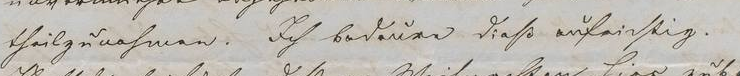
theilzunehmen. Ich bedaure dieß aufrichtig.
